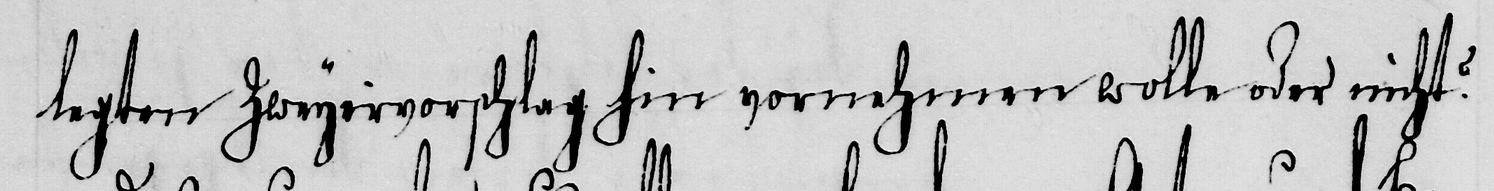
legten Zweyervorschlag hin vornehmen wolle oder nicht?
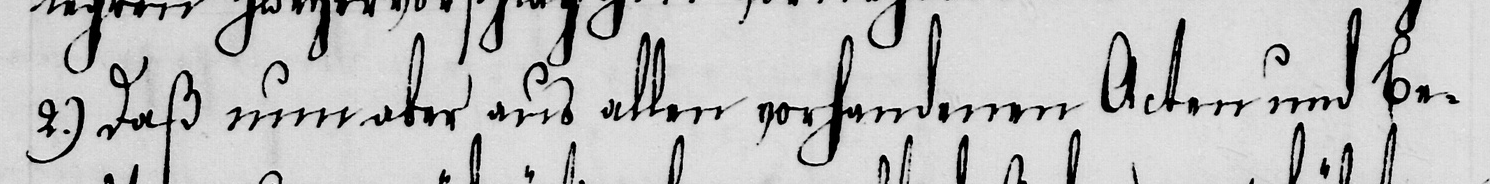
2.) Daß nun aber aus allen vorhandenen Acten und Be¬
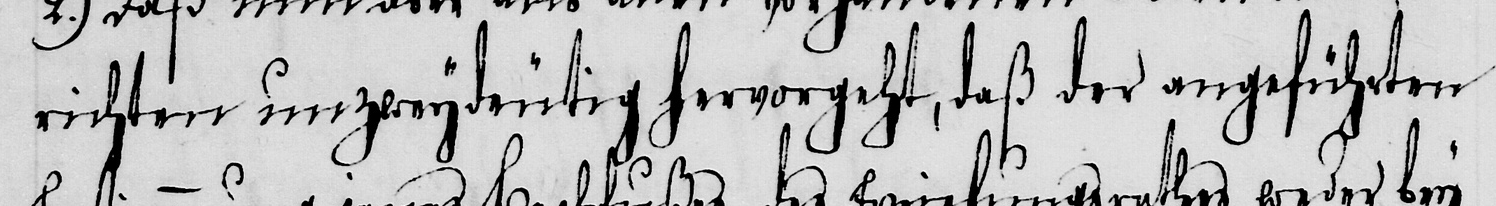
richten unzweydeutig hervorgeht, daß der angeführten
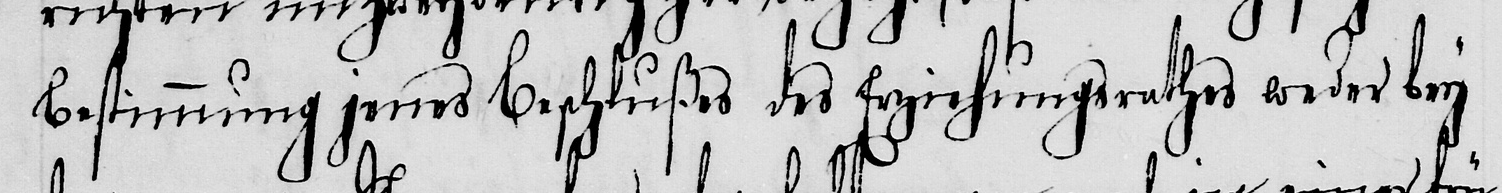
Bestimmung jenes Beschlußes des Erziehungsrathes weder bey
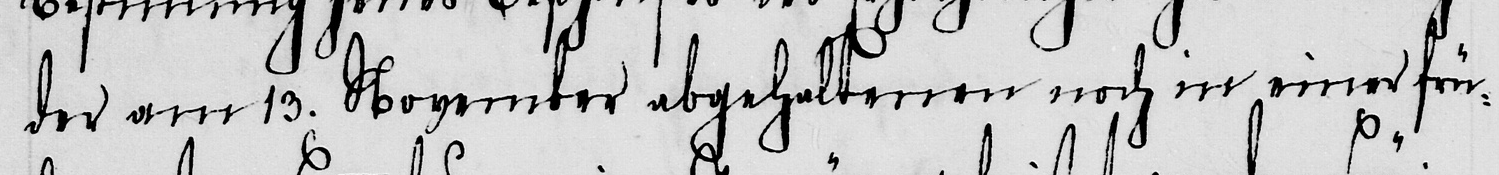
der am 13. November abgehaltenen noch in einer frü¬
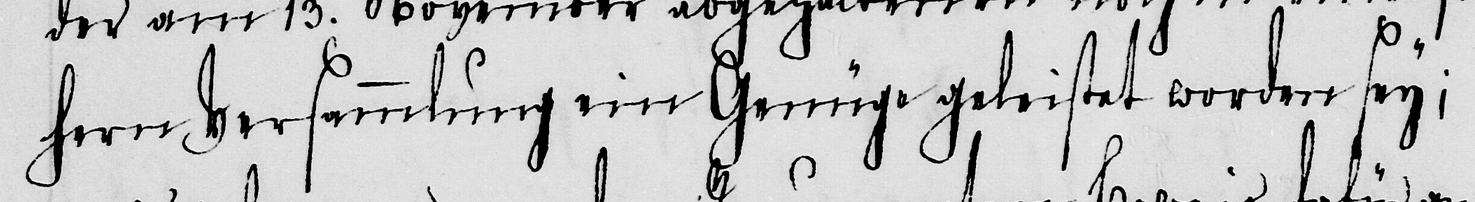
hern Versammlung ein Genüge geleistet worden sey;
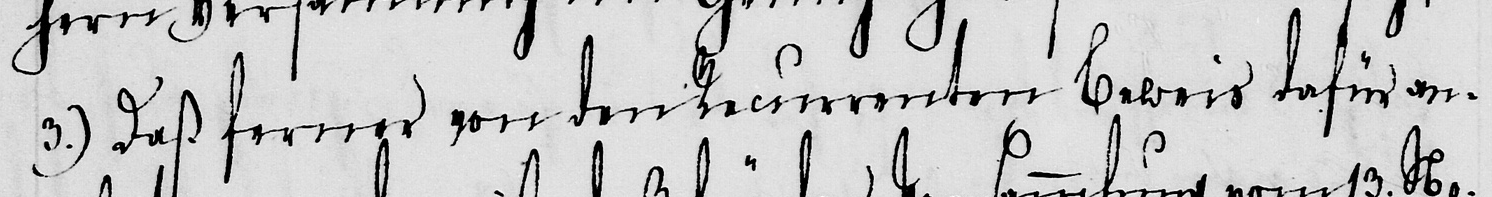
3.) Daß ferner von den Recurrenten Beweis dafür an¬
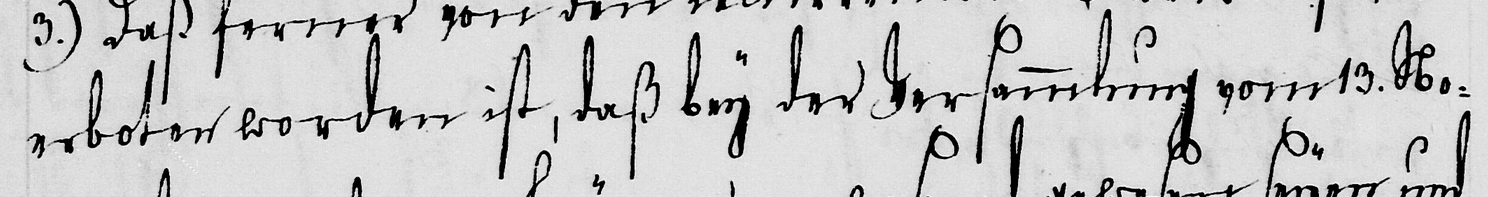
erboten worden ist, daß bey der Versammlung vom 13. No¬
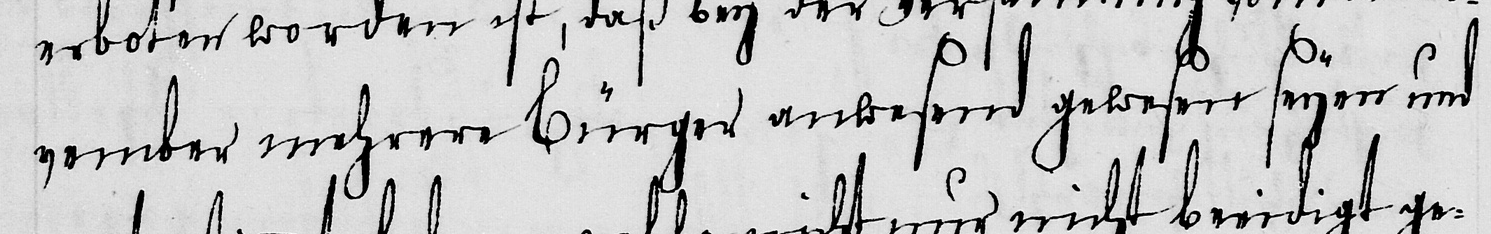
vember mehrere Bürger anwesend gewesen seyen und
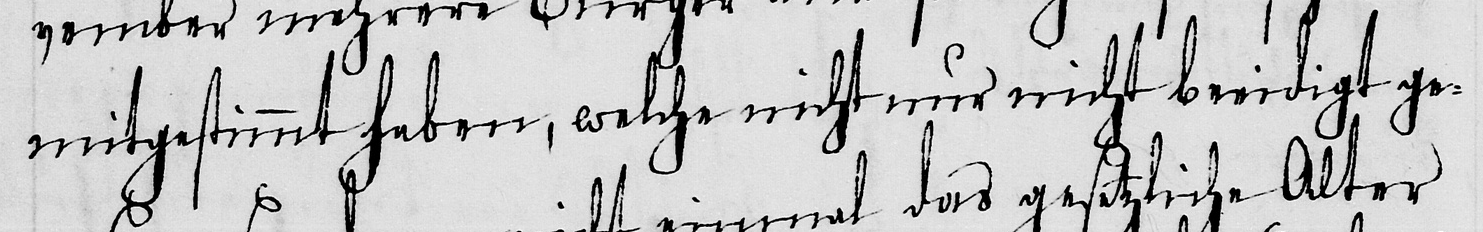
mitgestimmt haben, welche nicht nur nicht beeidigt ge¬
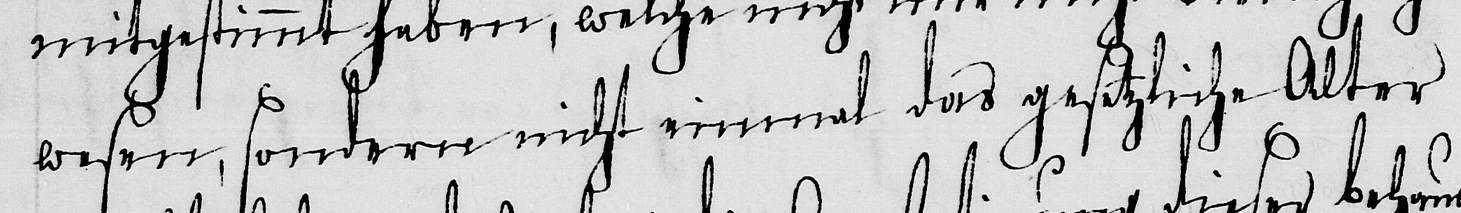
wesen, sondern nicht einmahl das gesetzliche Alter
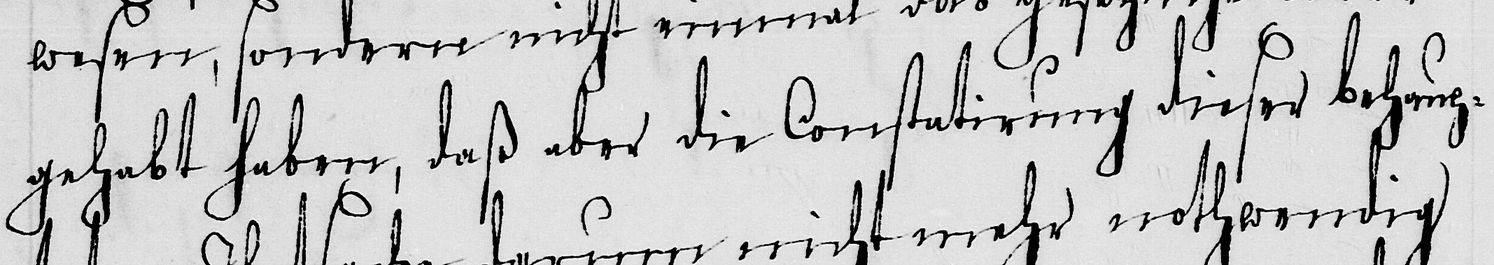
gehabt haben, daß aber die Constatirung dieser behaup¬
